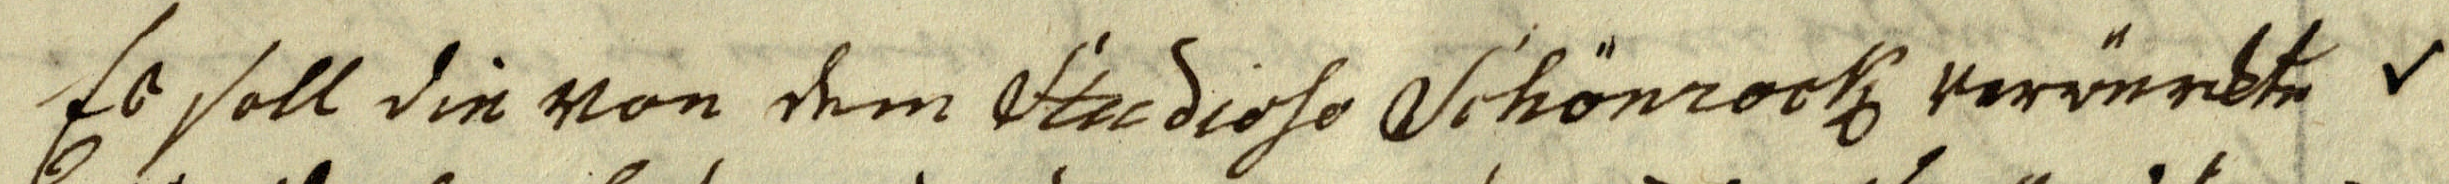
Es soll die von dem Studioso Schönrock verwürckte
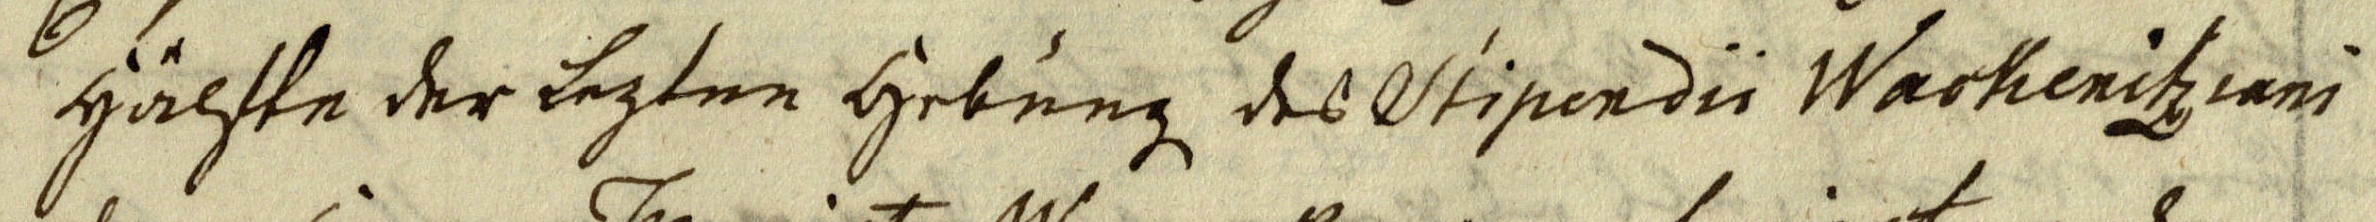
Hälfte der lezten Hebung des Stipendii Wackenitziani
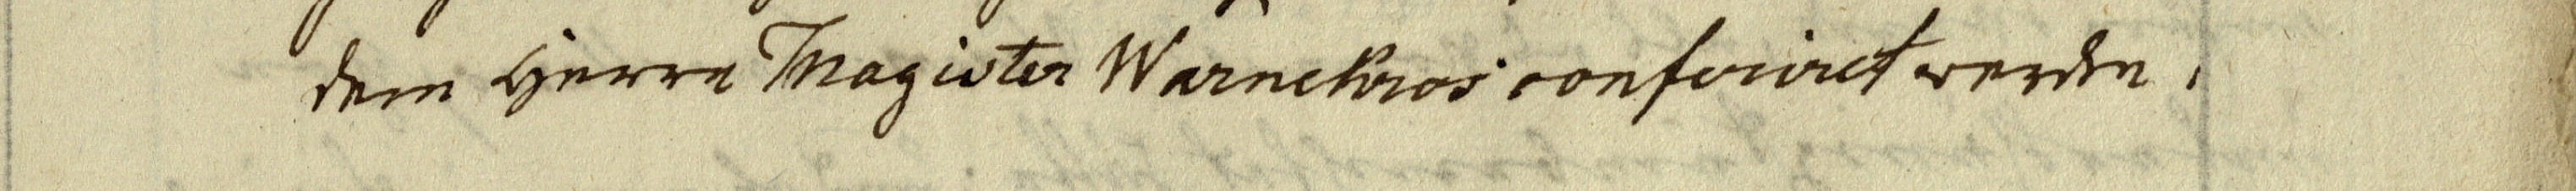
dem Herrn Magister Warnekros conferiret werden.
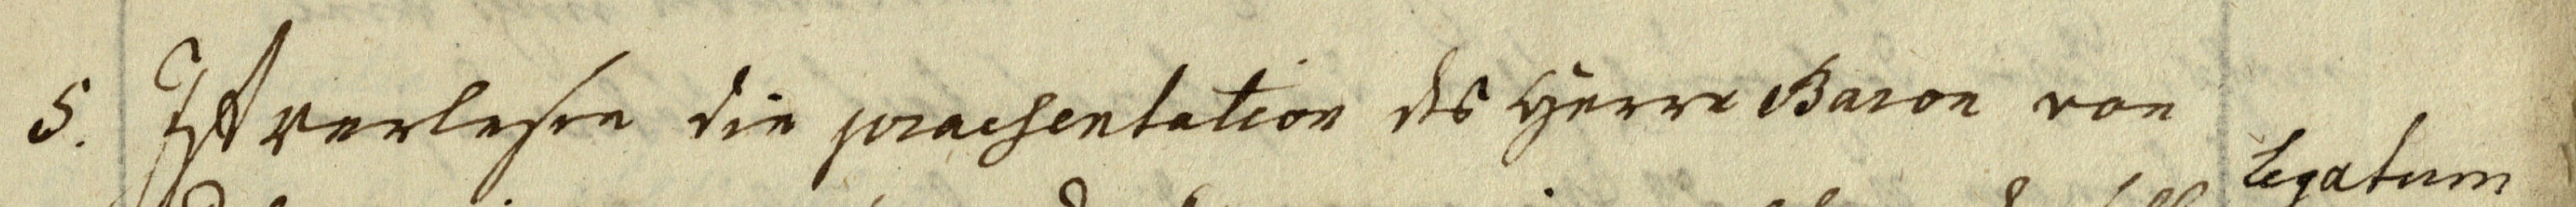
5. Ist verlesen die praesentation des Herrn Baron von
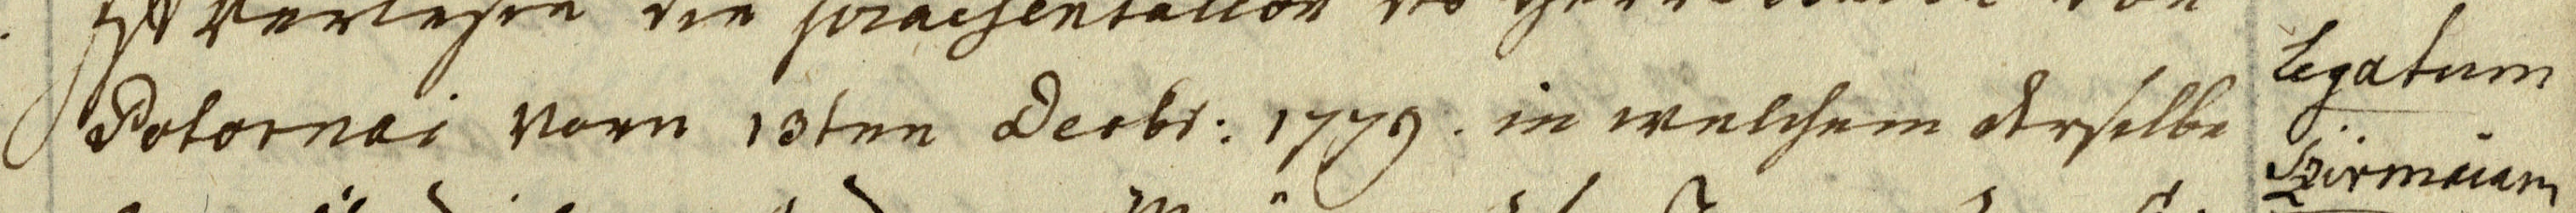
Potornai vorn 13ten Decbr: 1779. in welchem derselbe Legatum
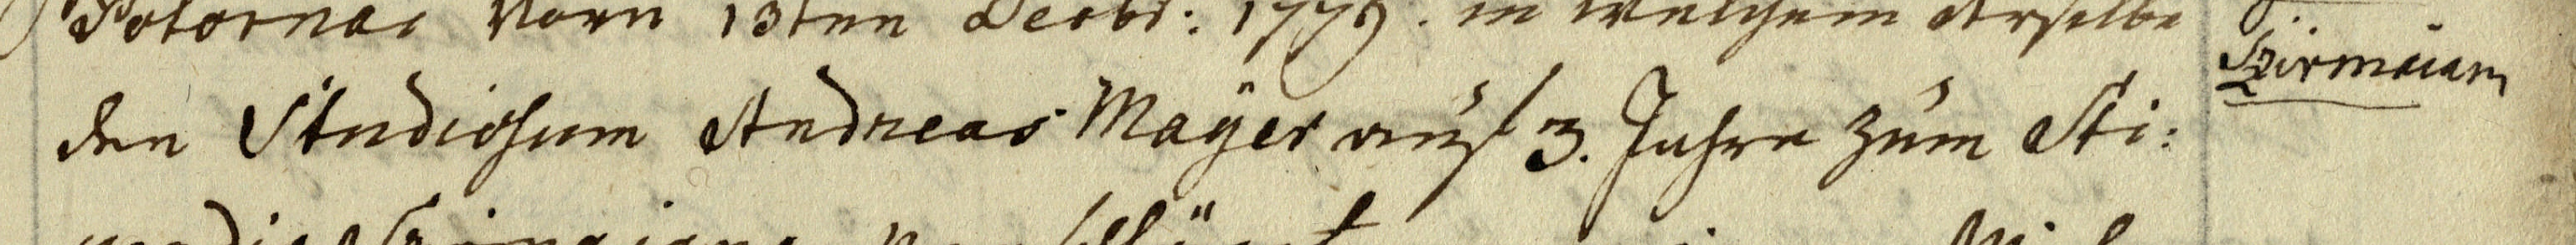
den Studiosum Andreas Maÿer auf 3. Jahre zum Sti¬ Szirmaiam
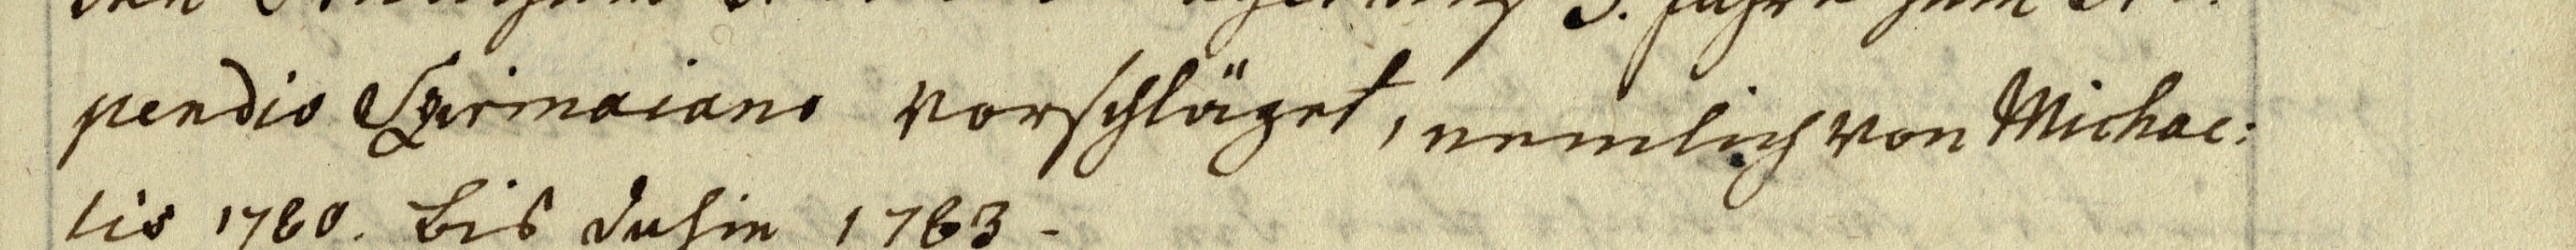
pendio Szirmaiano vorschläget, nemlich von Michae¬
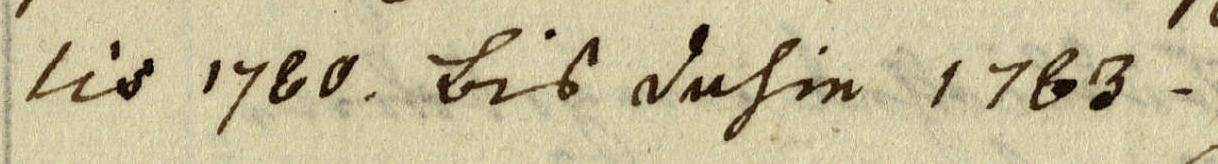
lis 1780 bis dahin 1783.
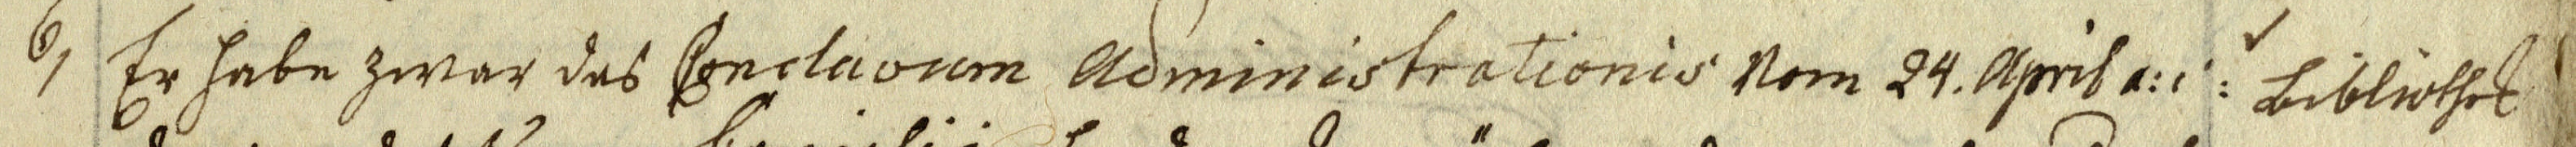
6. Es habe zwar das Conclusum Administrationis vom 24. April a. c. Bibliothek
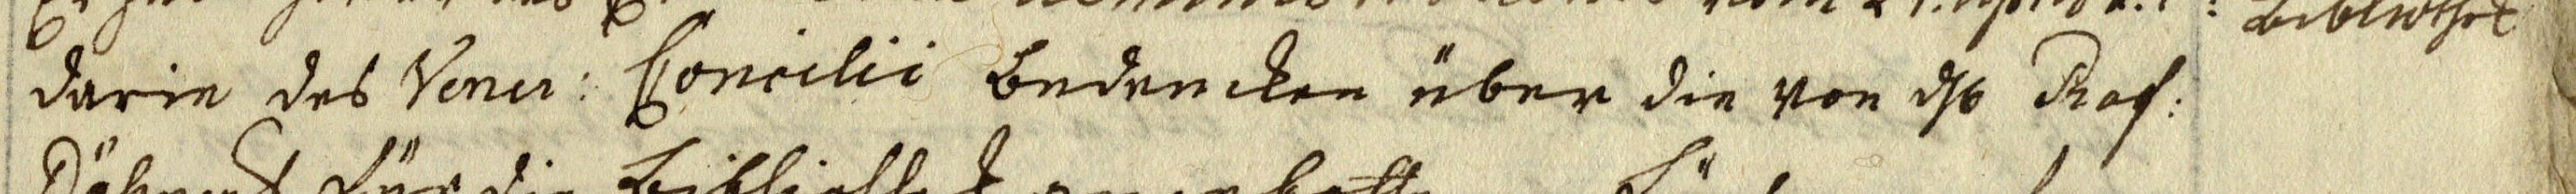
darin das Vener. Concilii Bedencken über die von dh Prof.
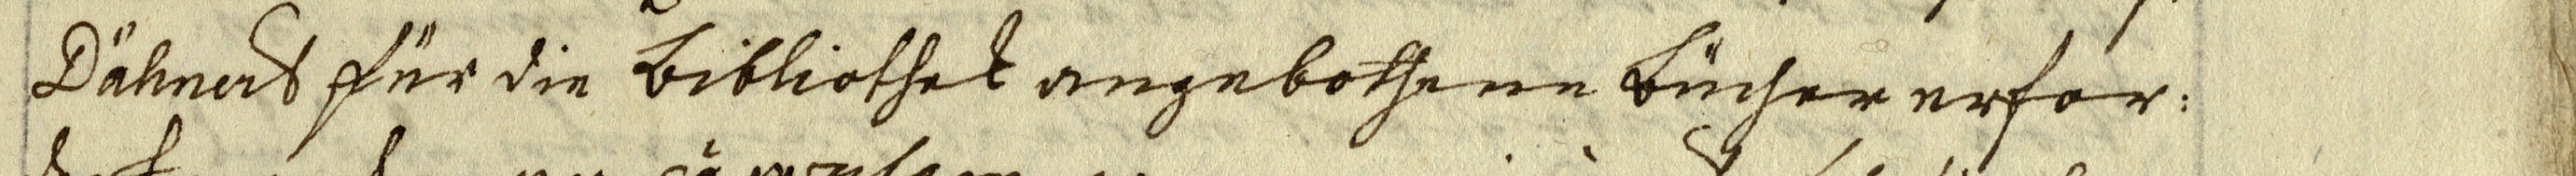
Dähnert für die Bibliothek angebothene Bücher erfor¬
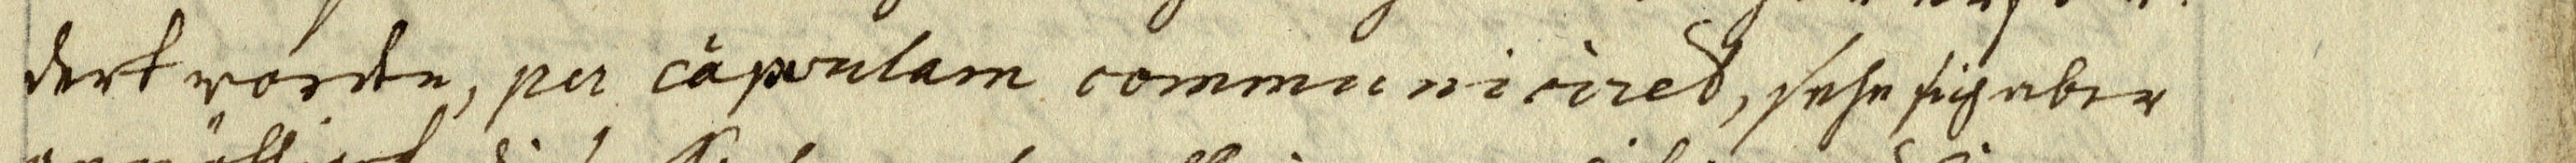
dert worden, per capsulam communiciret, sehe sich aber
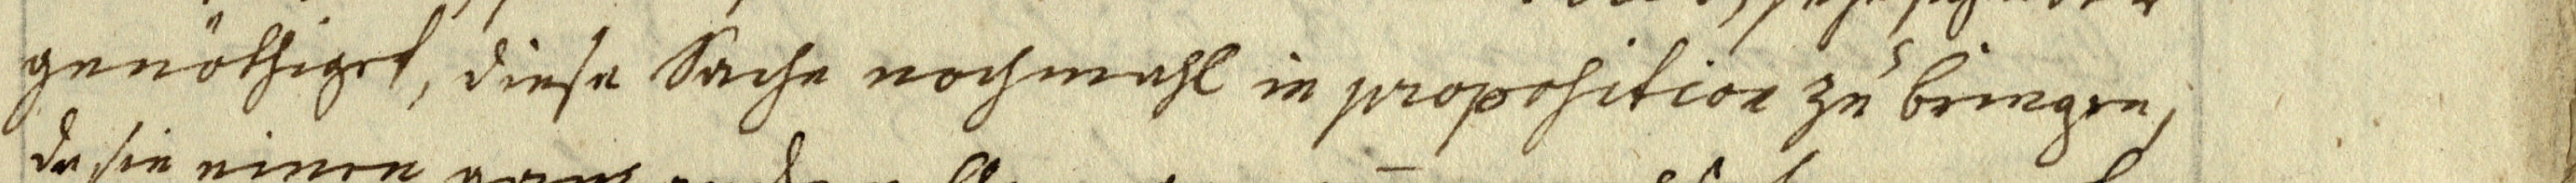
genöthiget, diese Sache nochmahl in proposition zu bringen,
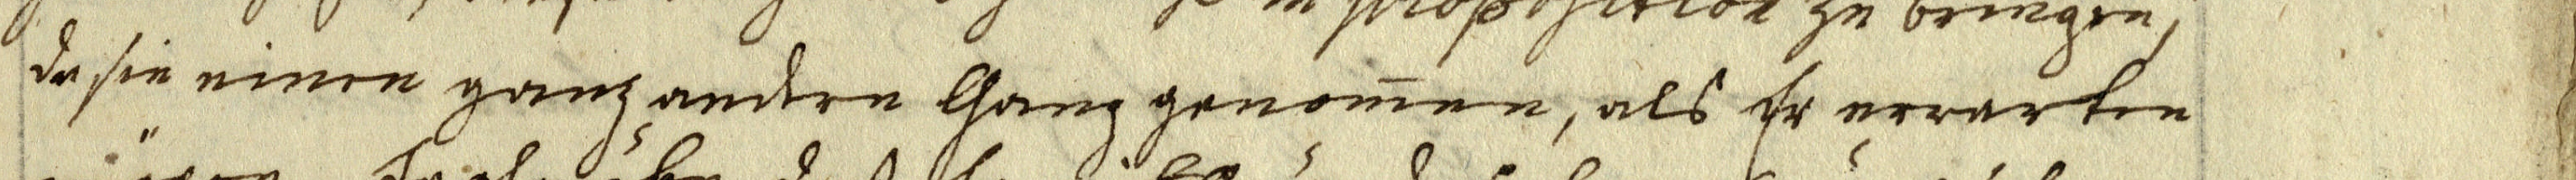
da sie einen ganz andern Gang genomen, als Er erwarten
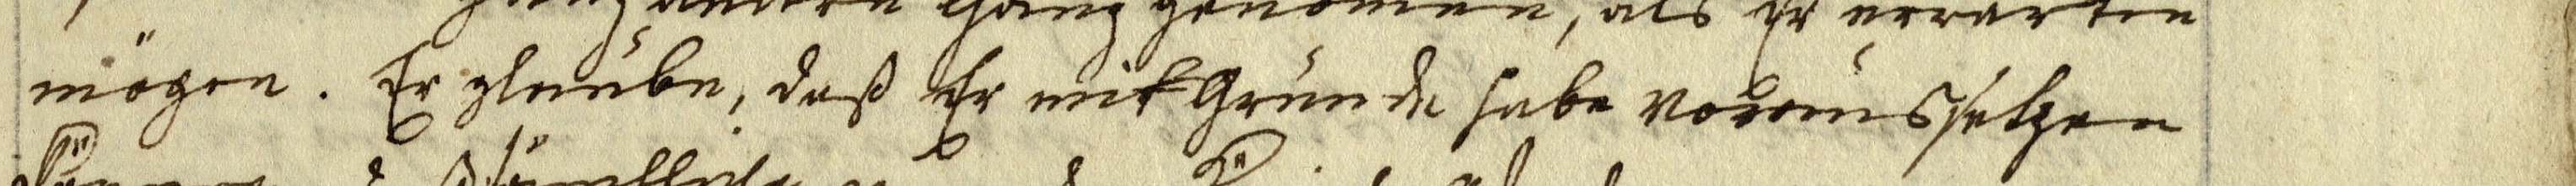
mögen. Er glaube, daß Er mit Grunde habe voraussetzen
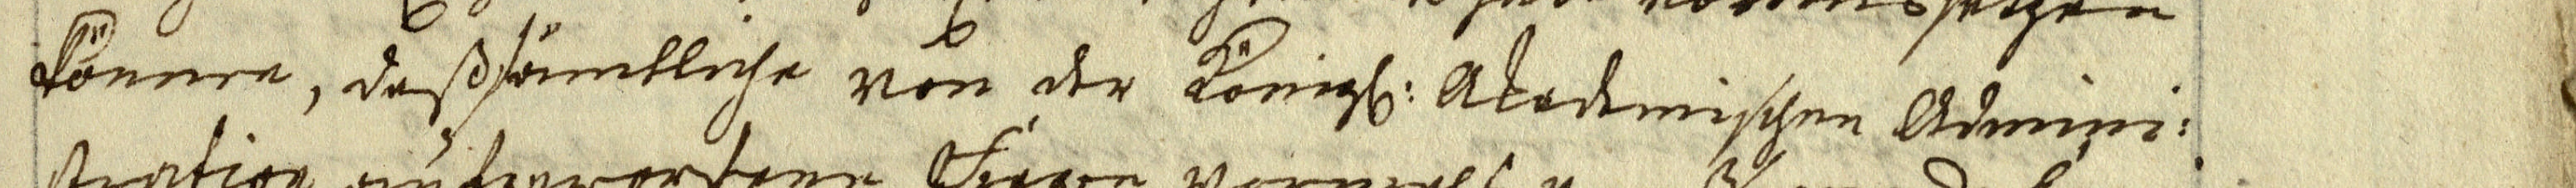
können, daß sämtliche von der Königl. Academischen Admini¬
